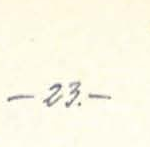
23
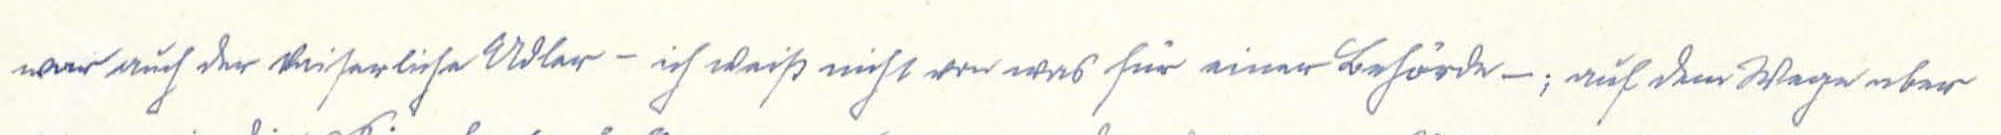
war auch der kaiserliche Adler- ich weiß nicht von was für einer Behörde -; auf dem Wege aber
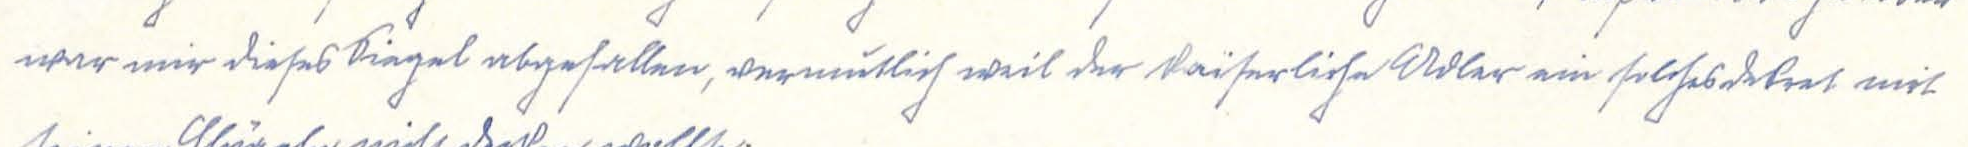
war mir dieses Siegel abgefallen, vermutlich weil der kaiserliche Adler ein solches Dekret mit
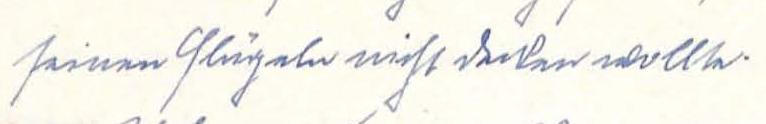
seinen Flügele nicht decken wollte-
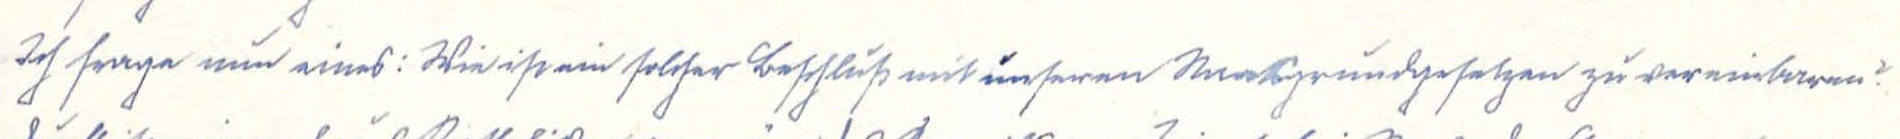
Ich frage nun eines: Wie ist ein solcher Beschluß mit unseren Staatsgrundgesetzen zu vereinbaren?
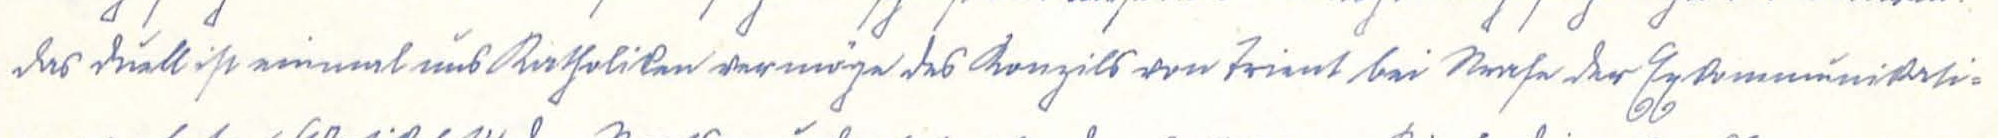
Das Duell ist einmal uns Katholiken vermöge des Konzils von Trient bei Strafe der Exkommunikati-
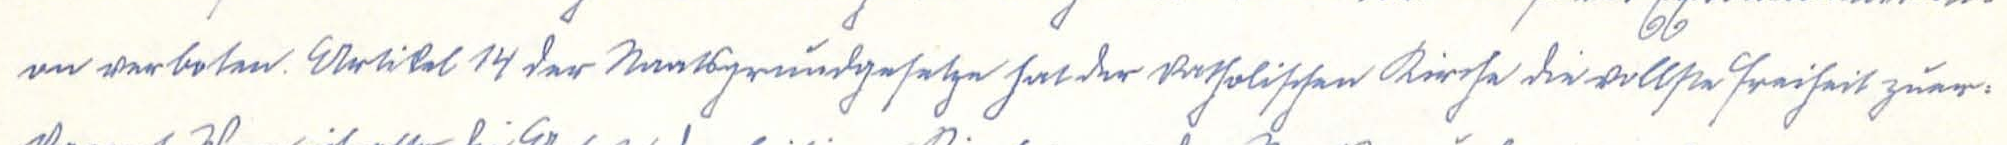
on verboten. Artikel 14 der Staatsgrundgesetze hat der katholischen Kirche die vollste Freiheit zuer-
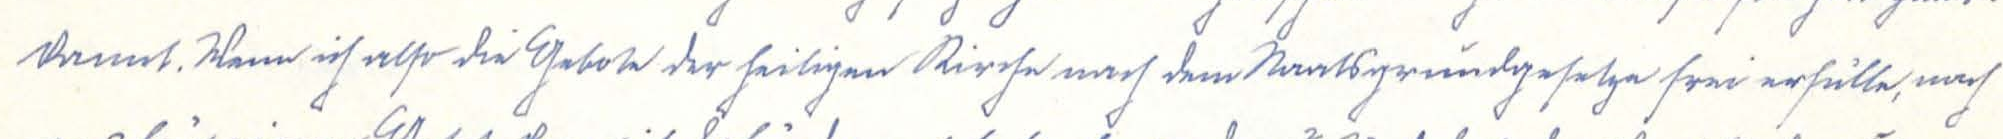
kannt. Wenn ich also die Gebote der heiligen Kirche nach dem Staatsgrundgesetze frei erfülle, nach
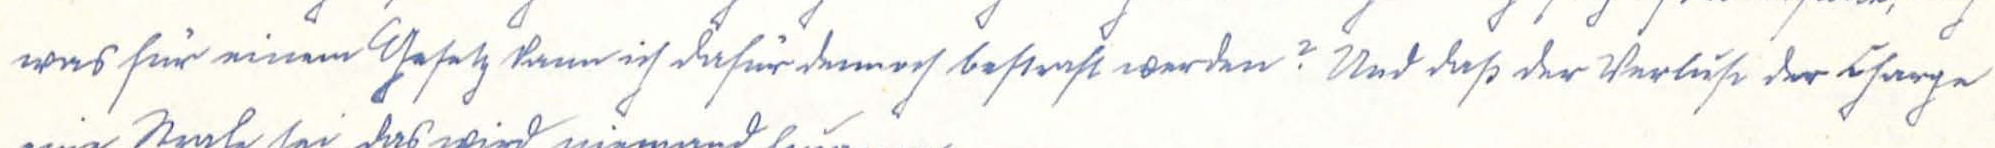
was für einem Gesetz, kann ich dafür dennoch bestraft werden? Und daß der Verlust der Charge
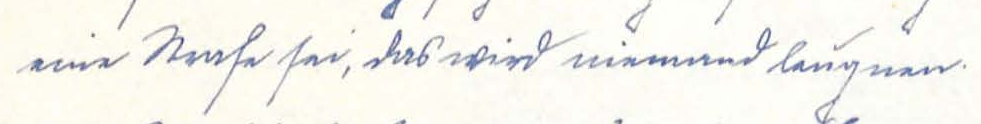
eine Strafe sei, das wird niemand leugnen.
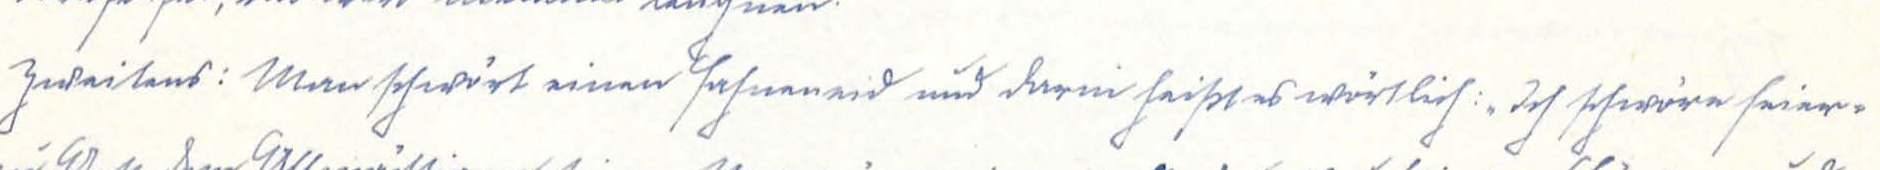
Zweitens: Man schwört einen Fahneneid und darin heißt es wörtlich:Ich schwöre feier-
